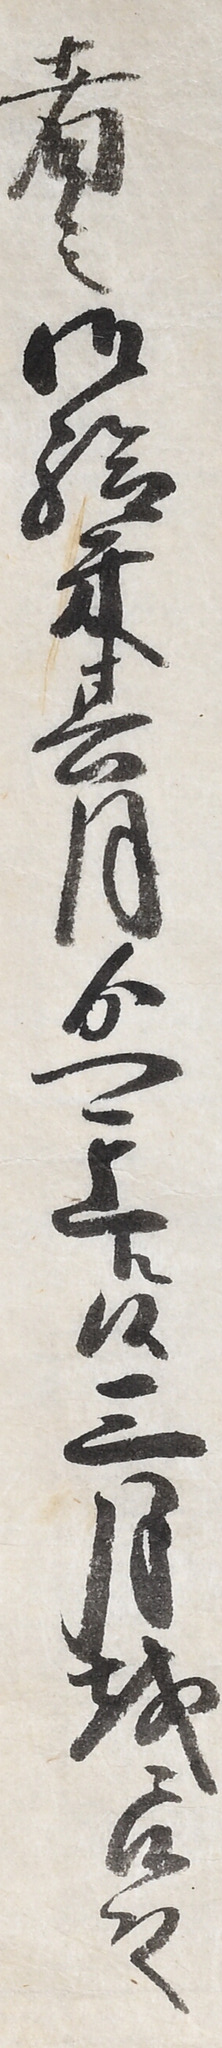者之御給米其月ゟ可上ル候三月越ニ候ハヽ
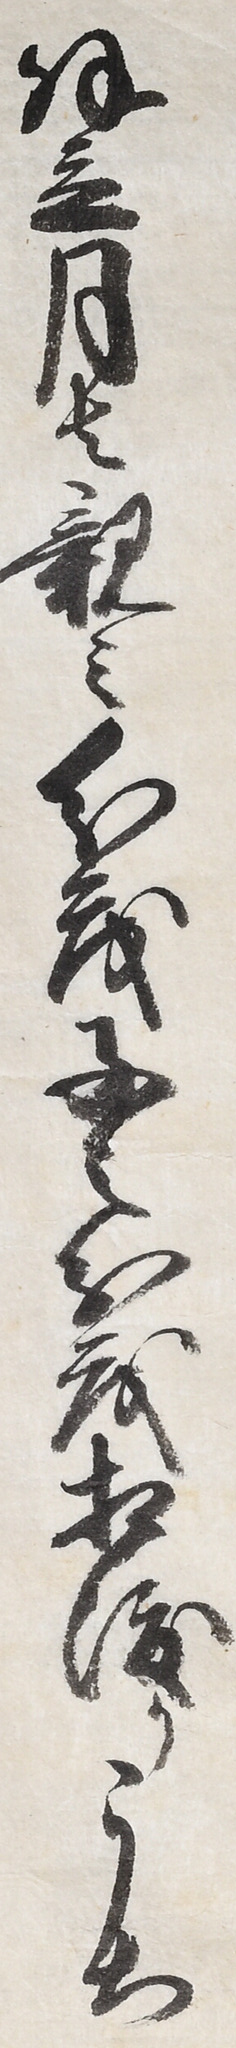翌月は親之分も子之分も相渡リうち
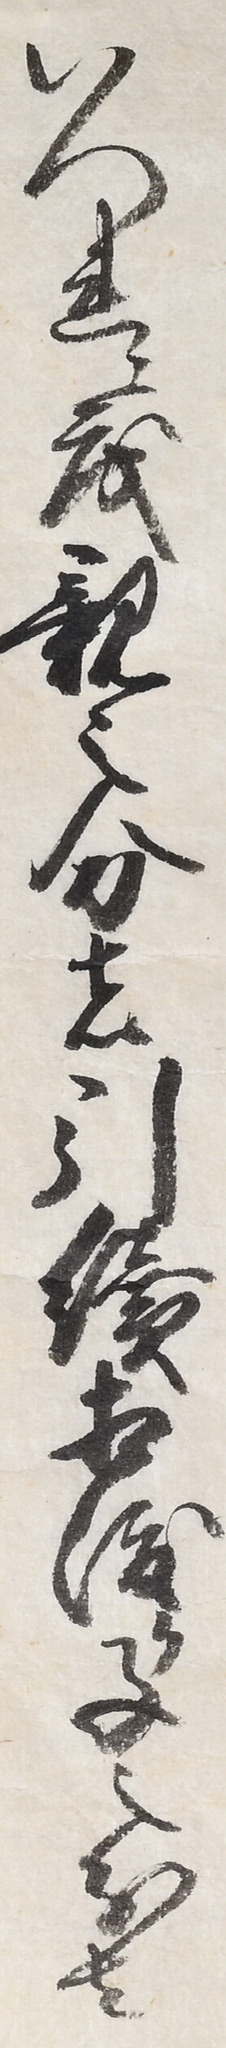いつれニも親之分は引続相渡リ子之分は
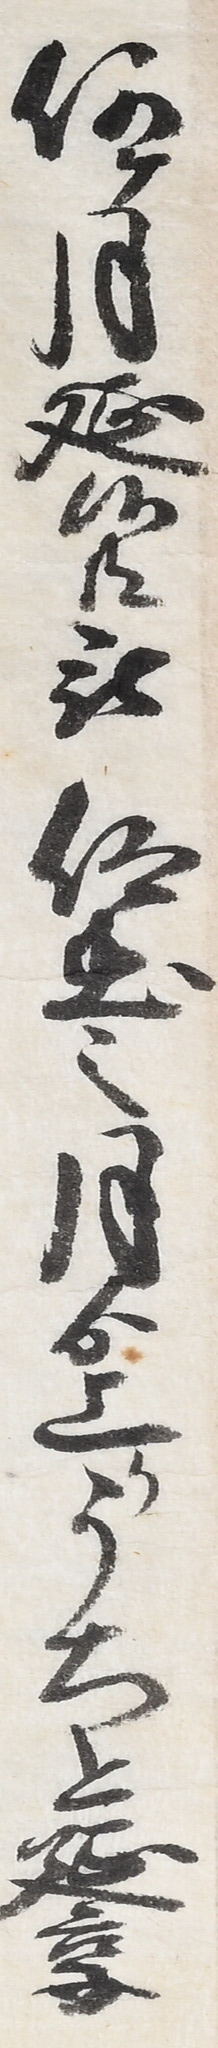何ヶ月延候共被仰出之月ゟ上リうちと延享
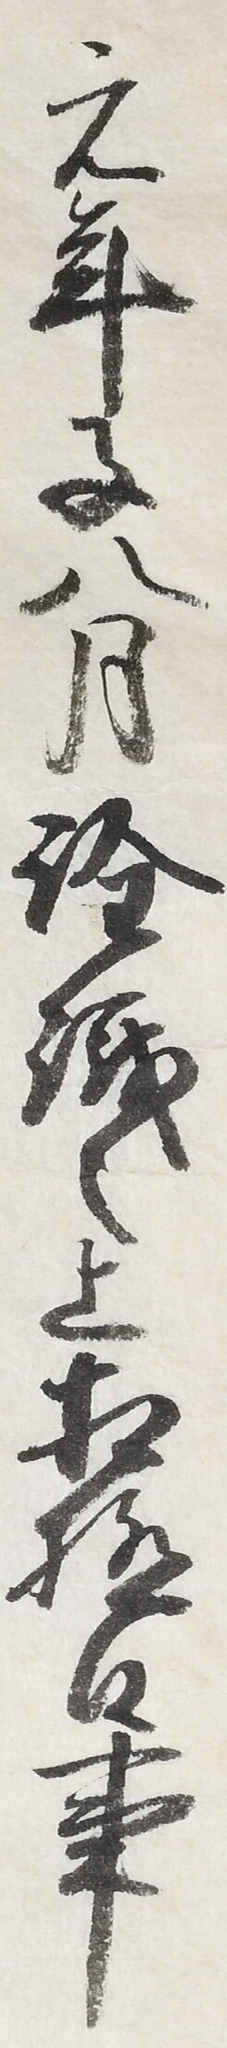元年子八月詮儀之上相極候事
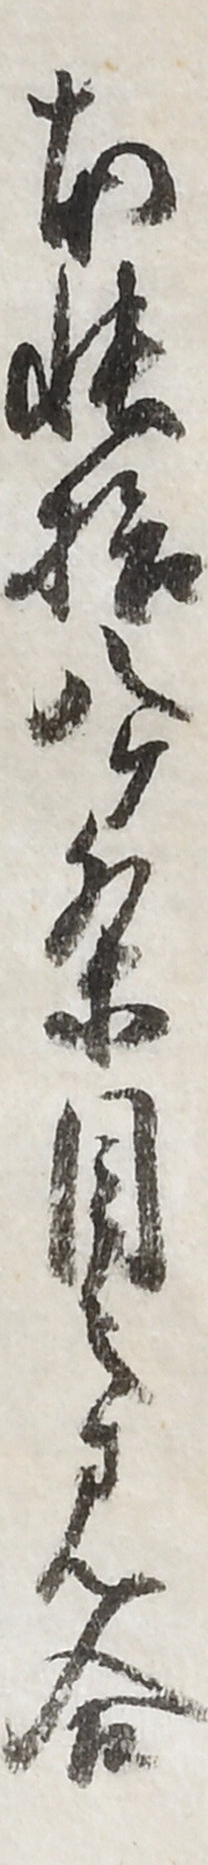本帳拾八ヶ条目之見合
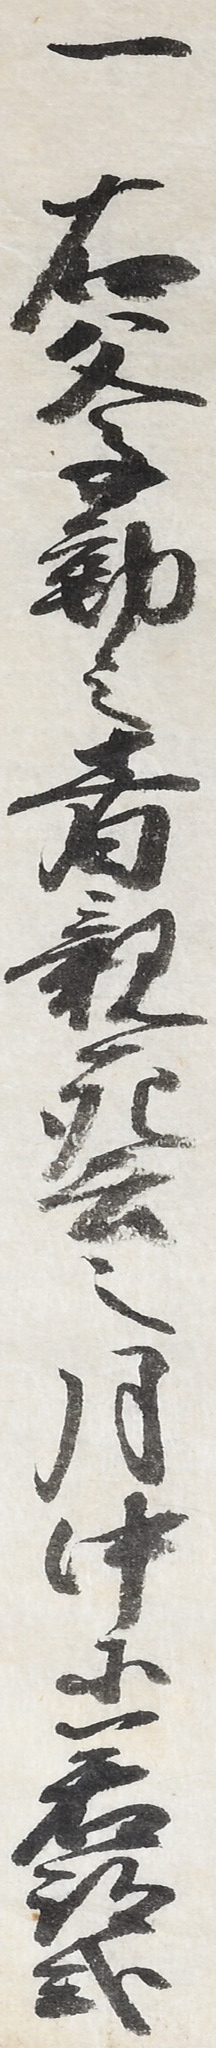一右父子勤之者親死去之月中に若跡式
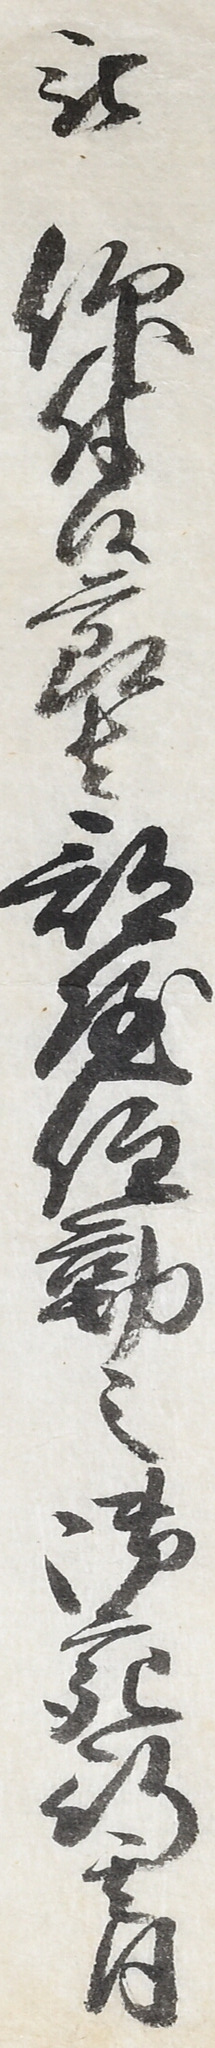被仰付候節は部屋住勤之御宛行其月
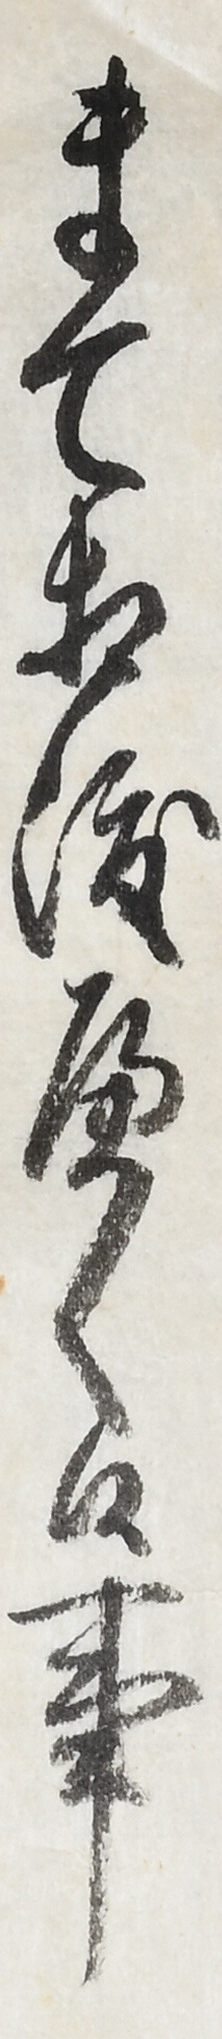まて相渡へく候事
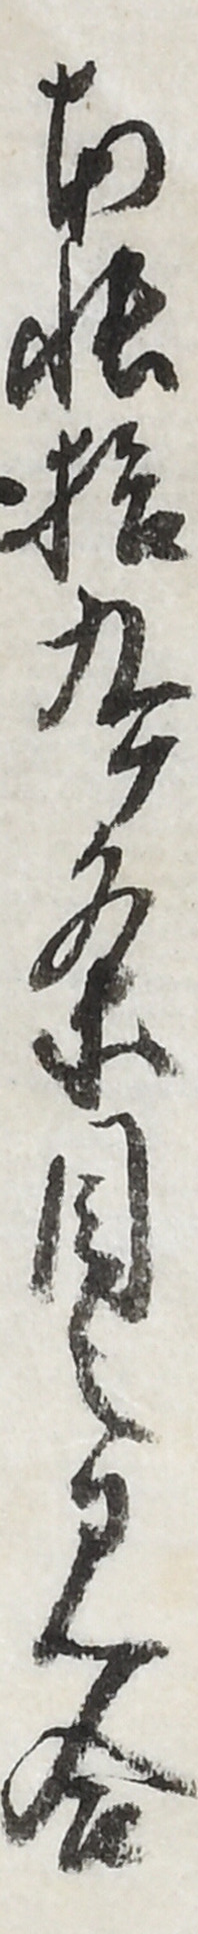本帳拾九ヶ条目之見合
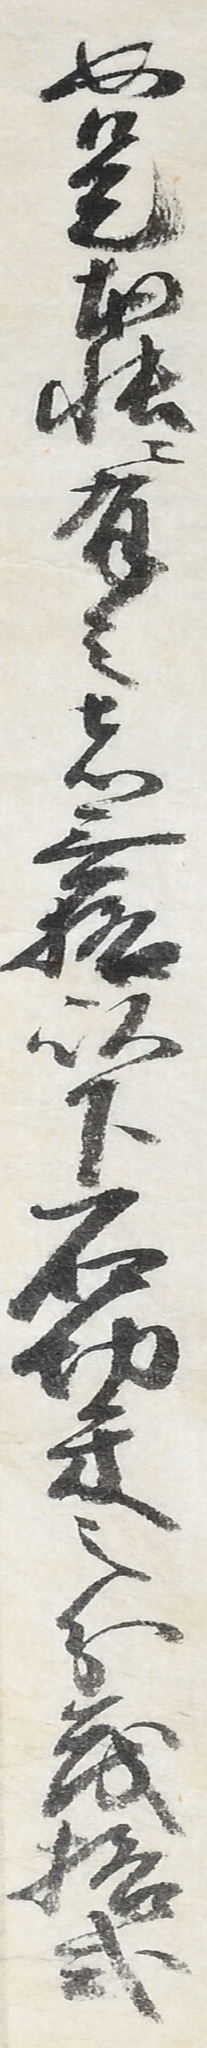如是本帳ニ有之者無格以下石切米之分も格式

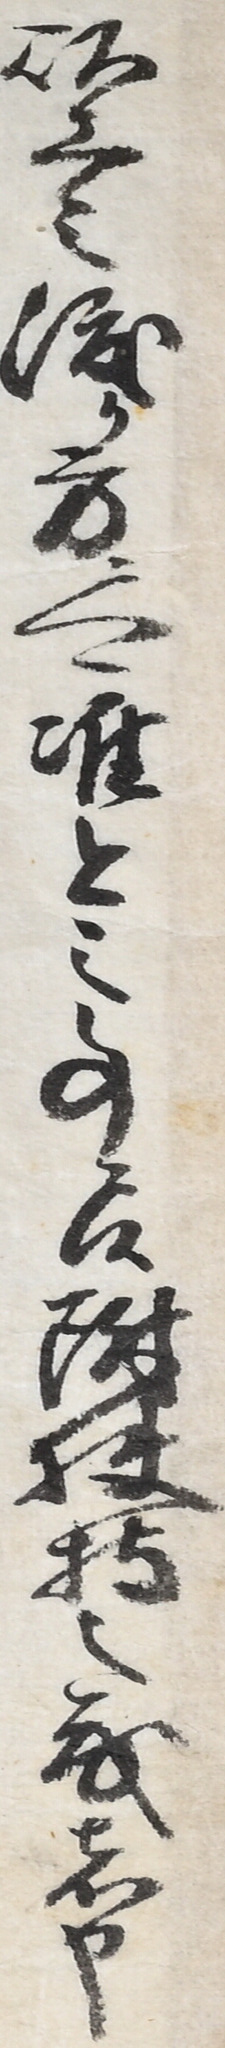以上之渡り方ニ可准と之事ニ候附扶持之義は申
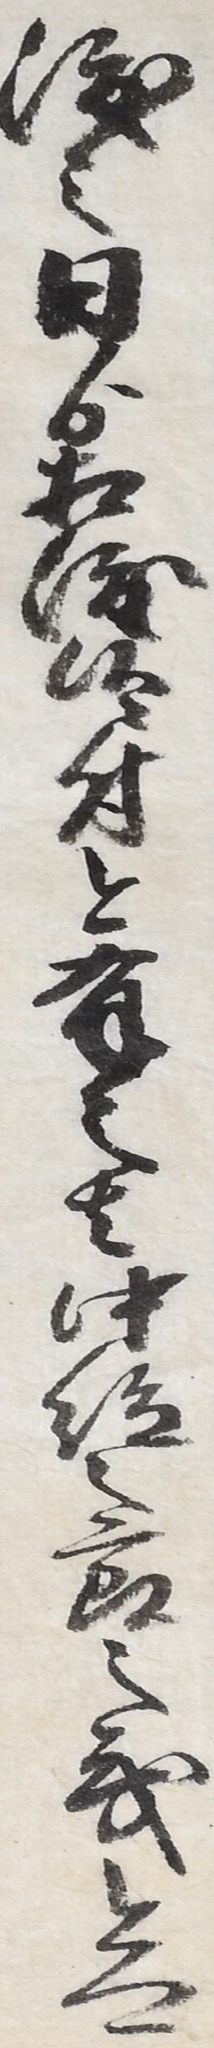渡之日ゟ相渡候ニ付と有之は中絶之節之義と可
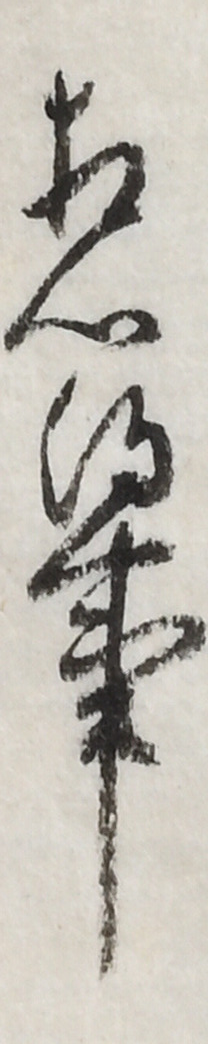相心得事
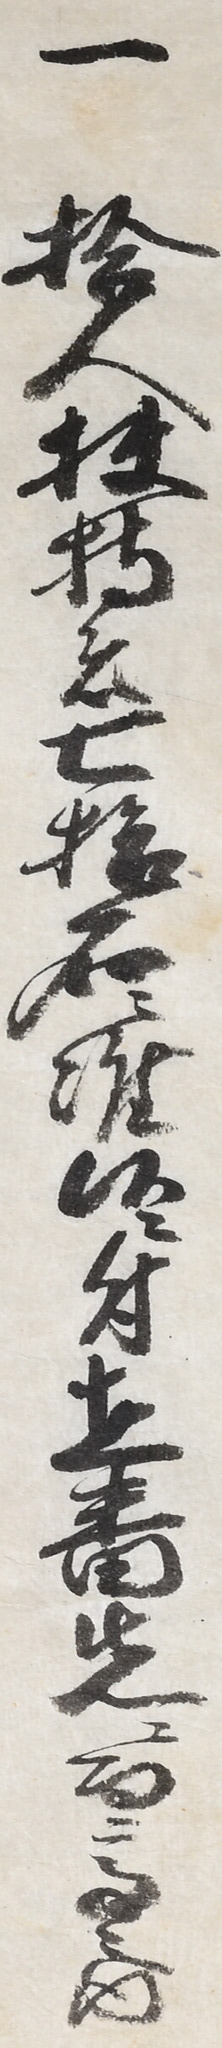一拾人扶持は七拾石ニ准候ニ付在番先ニ而高之内
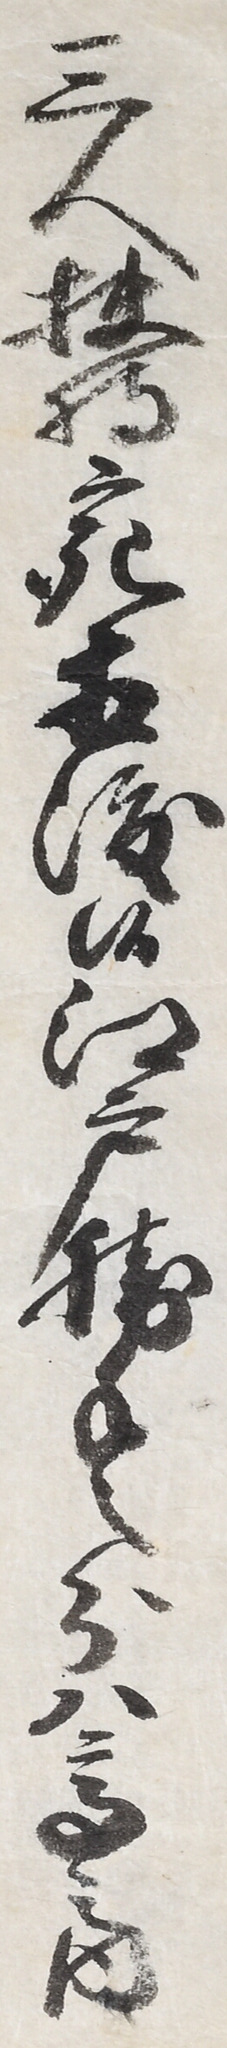三人扶持宛相渡候江戸勝手之分ハ高之内
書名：御給分渡り方定追加
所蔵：伊那市立高遠町図書館・合同会社AMANE
